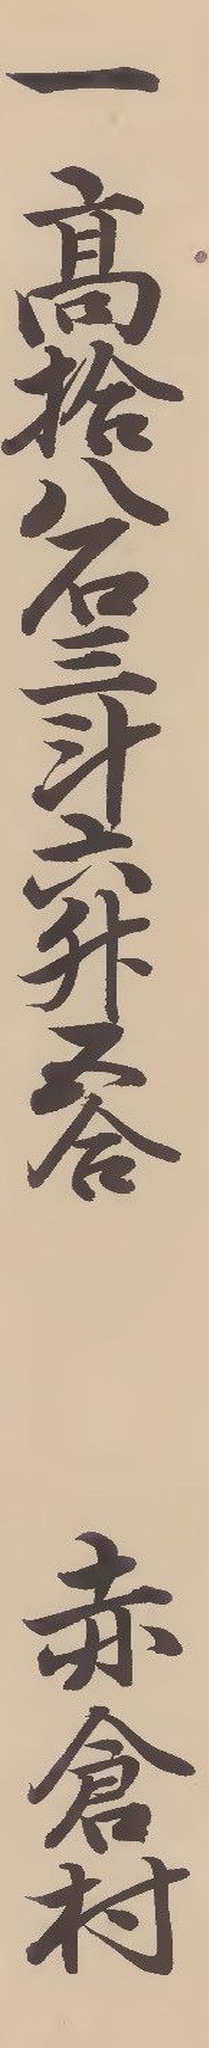一高拾八石三斗六升五合赤倉村
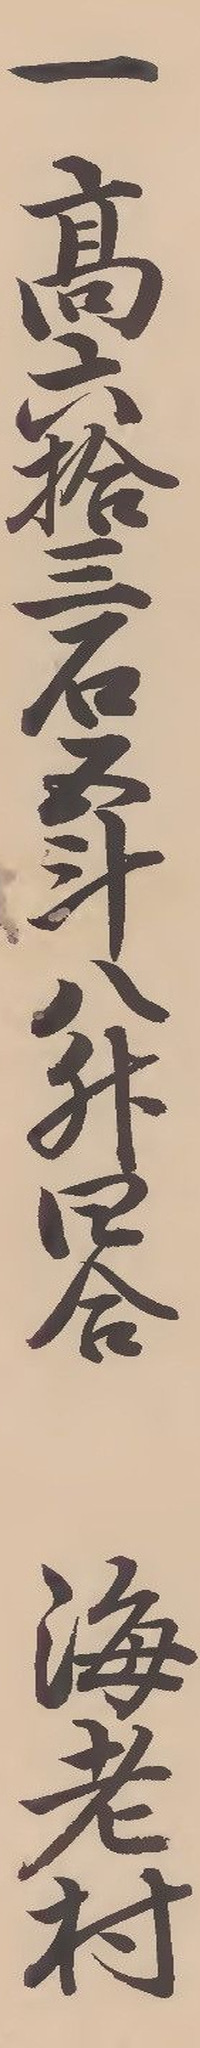一高六拾三石五斗八升四合海老村

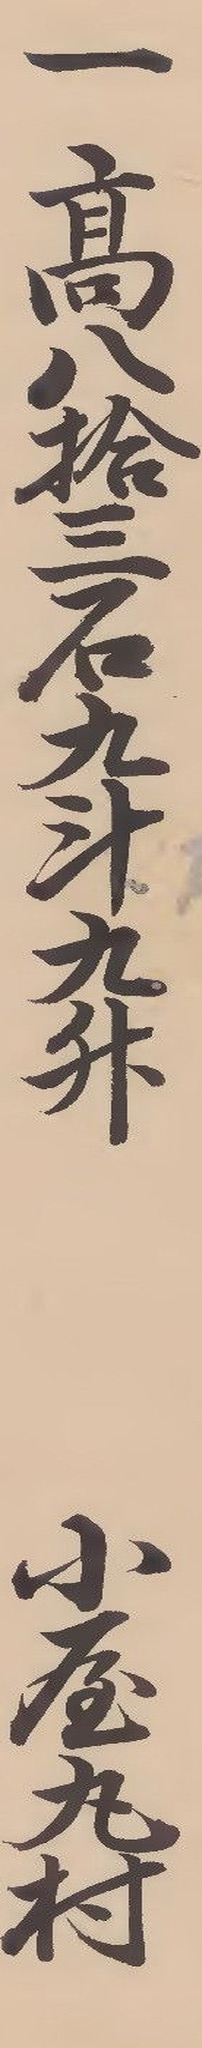一高八拾三石九斗九升小屋丸村
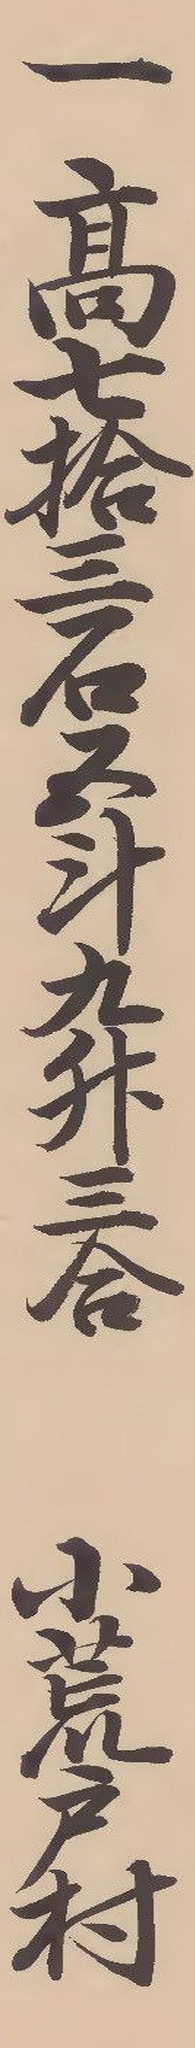一高七拾三石五斗九升三合小荒戸村
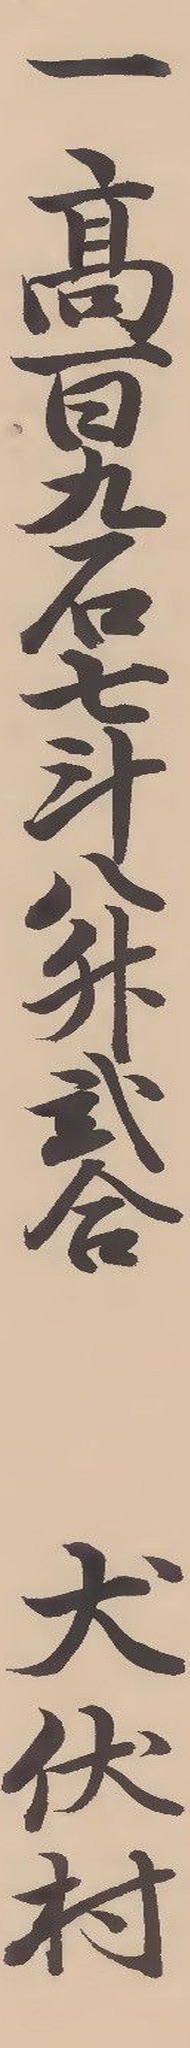一高百九石七斗八升弐合犬伏村
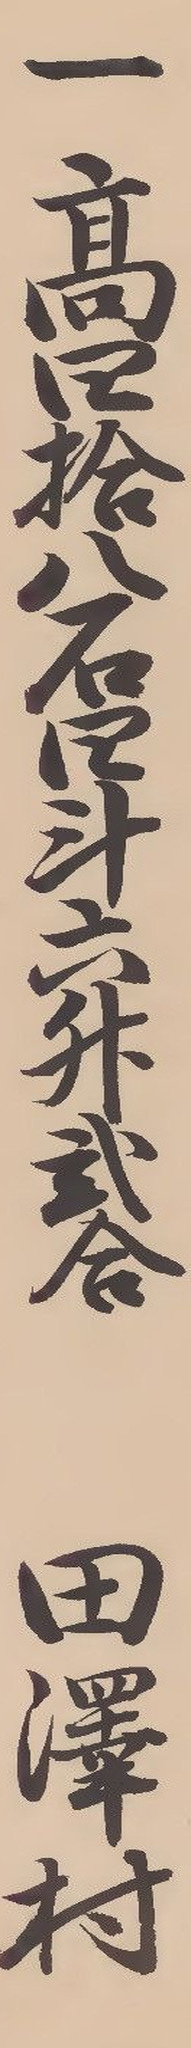一高四拾八石四斗六升弐合田沢村
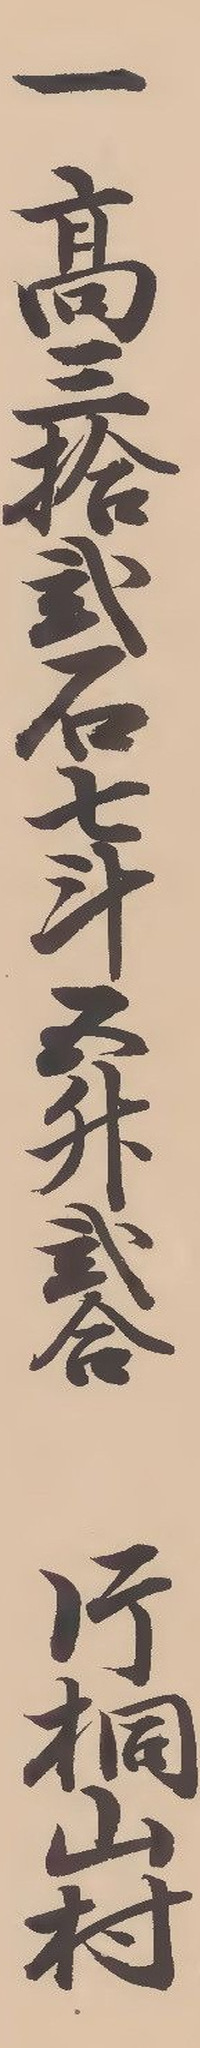一高三拾弐石七斗五升弐合片桐山村
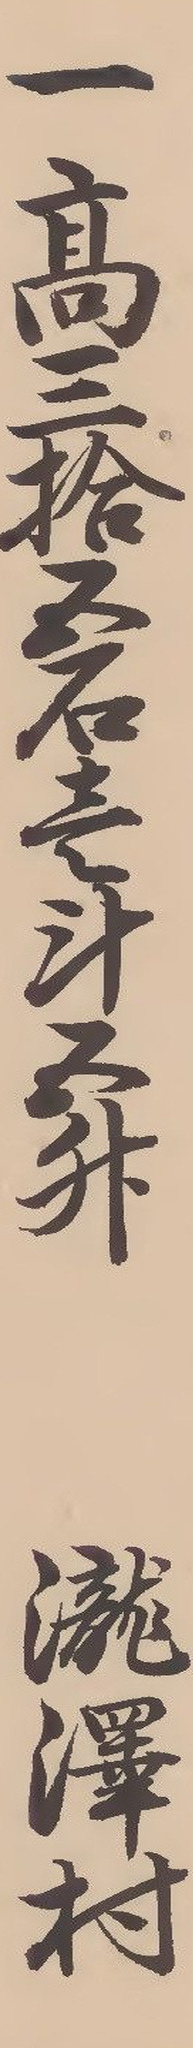一高三拾五石壱斗五升滝沢村
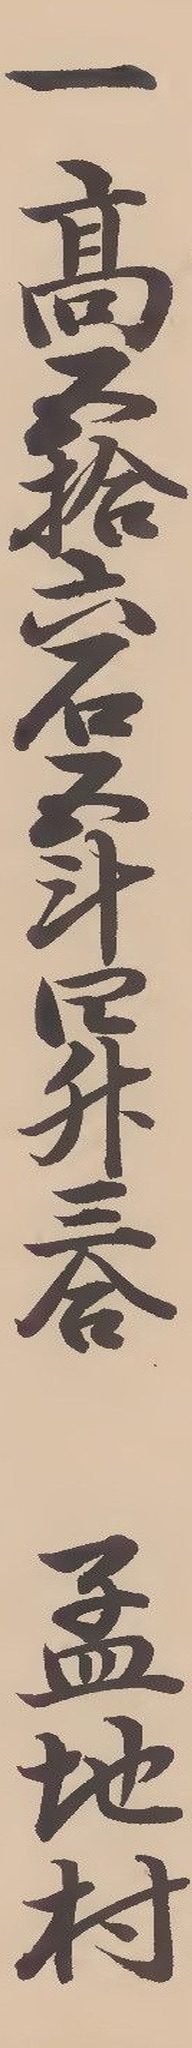一高五拾六石五斗四升三合孟地村
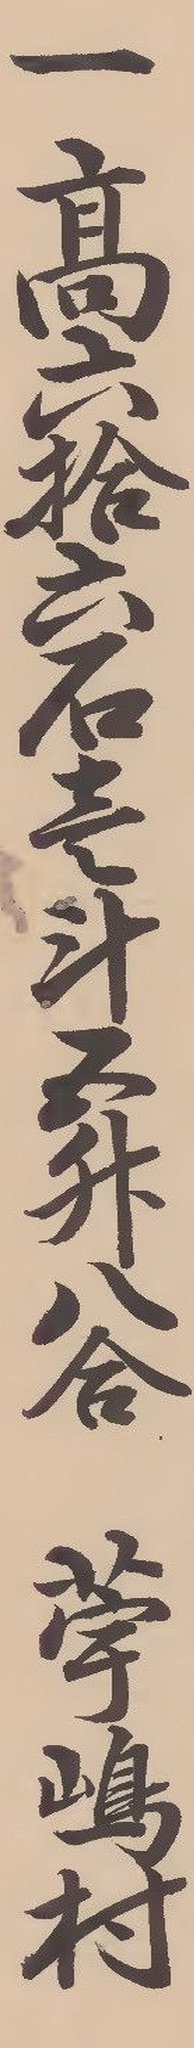一高六拾六石壱斗五升八合苧島村

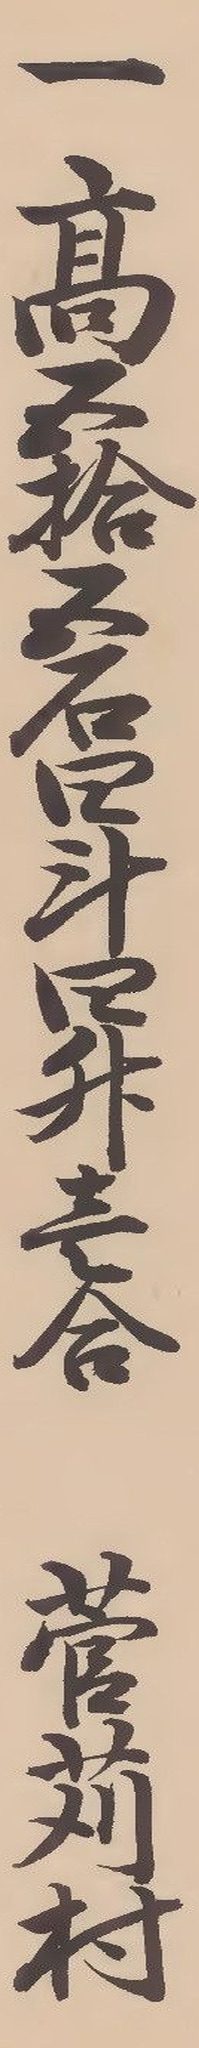一高五拾五石四斗四升壱合菅苅村
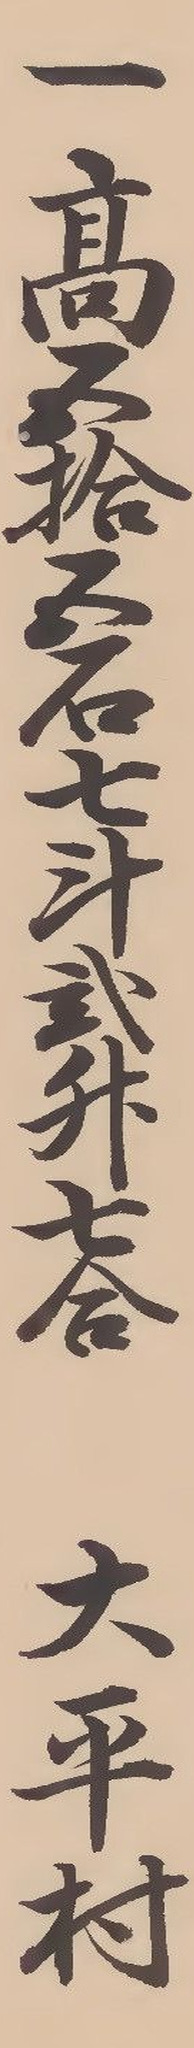一高五拾五石七斗弐升七合大平村
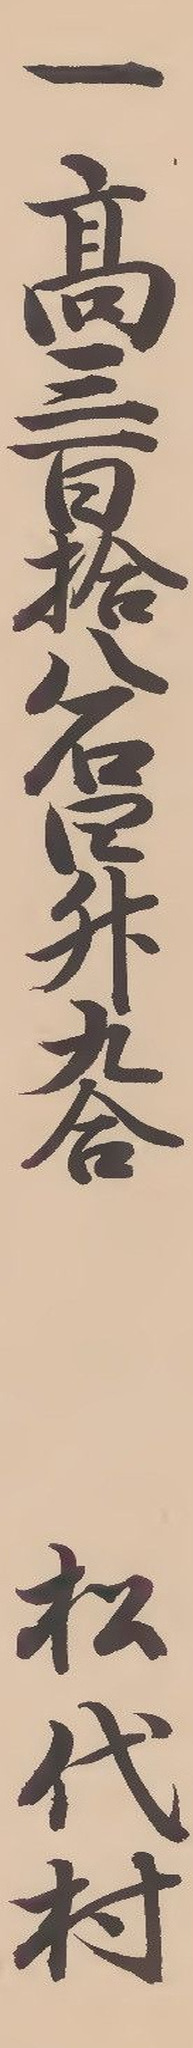一高三百拾八石四升九合松代村
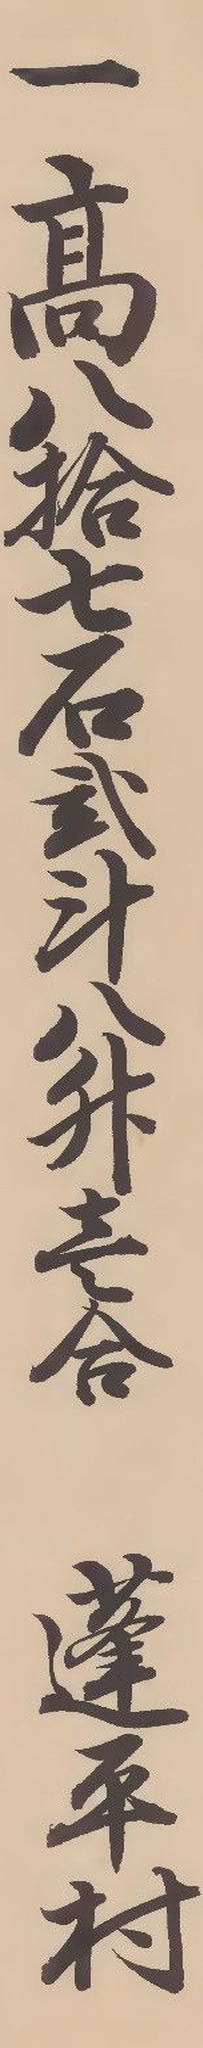一高八拾七石弐斗八升壱合蓬平村
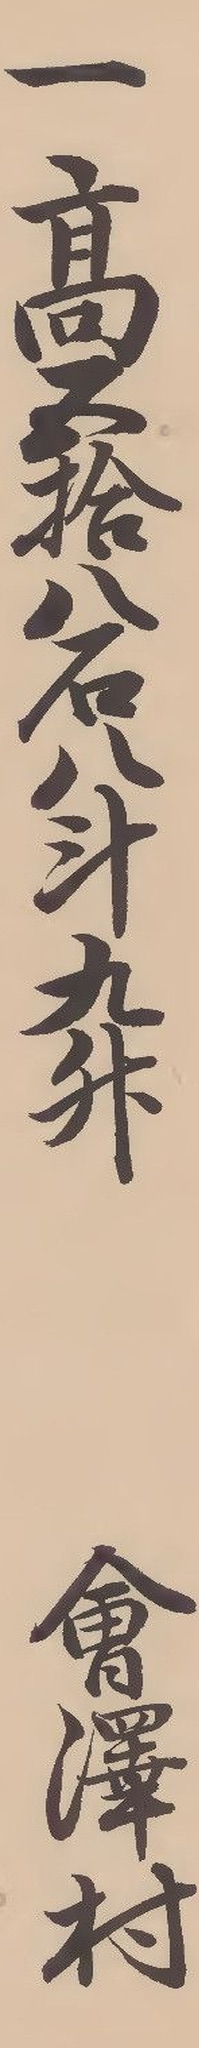一高五拾八石八斗九升会沢村
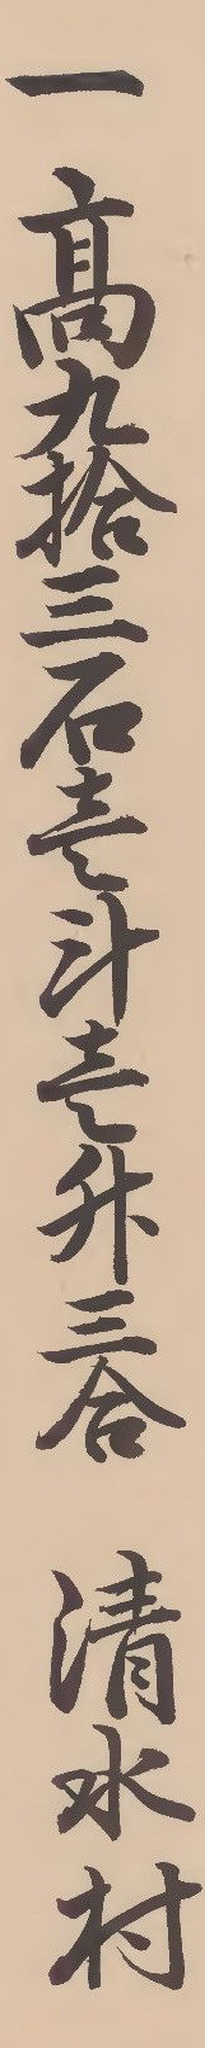一高九拾三石壱斗壱升三合清水村
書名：越後国郷帳　上
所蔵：国立公文書館 National Archives of Japan
